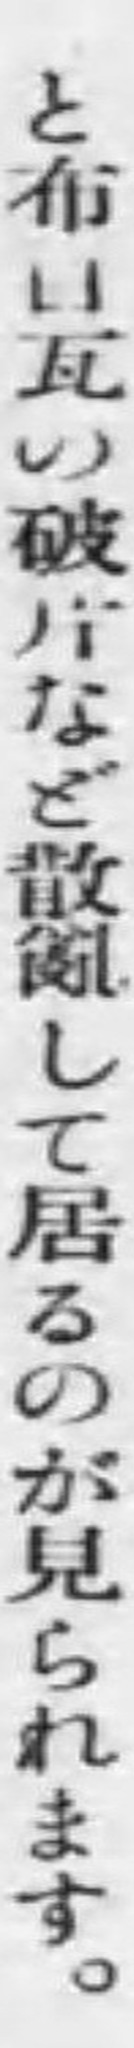と布目瓦の破片など散乱して居るのが見られます。
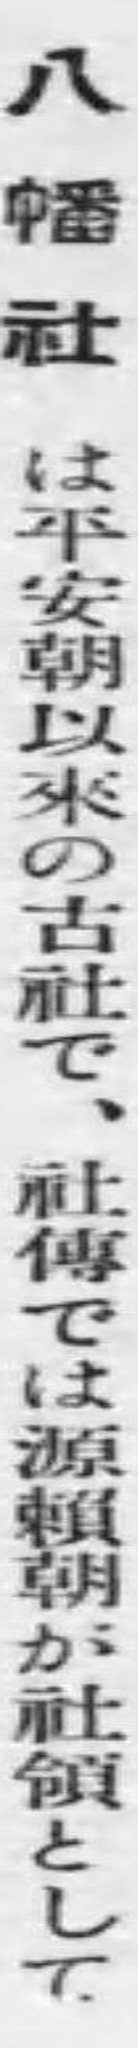八幡社は平安朝以来の古社で、社伝では源頼朝が社領として
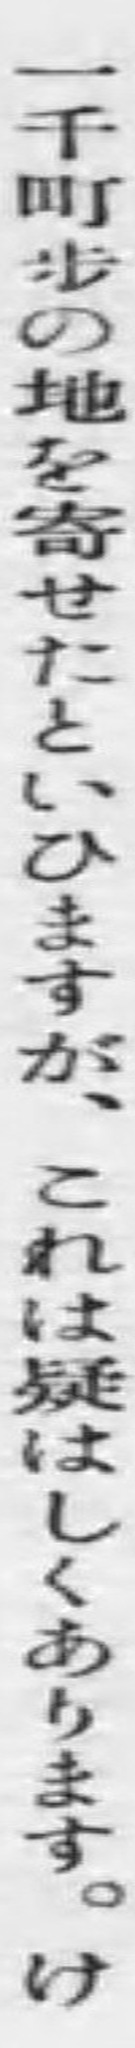一千町歩の地を寄せたといひますが、これは疑はしくあります。け
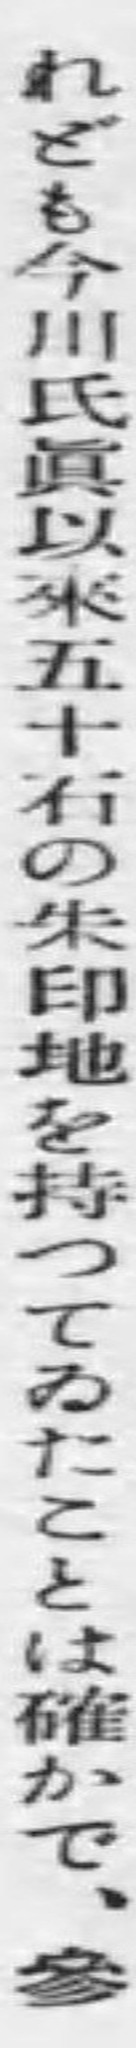れども今川氏真以来五十石の朱印地を持つてゐたことは確かで、参
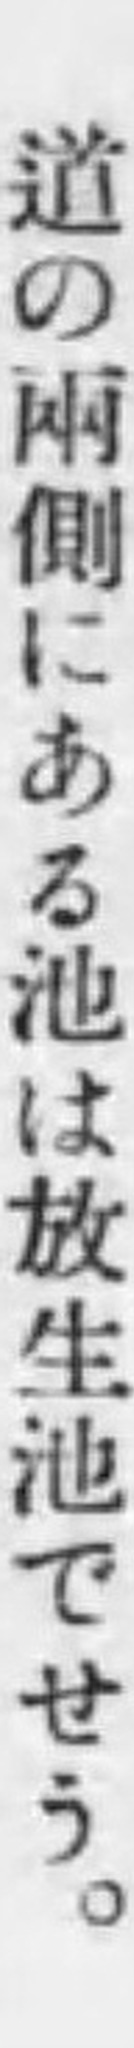道の両側にある池は放生池でせう。
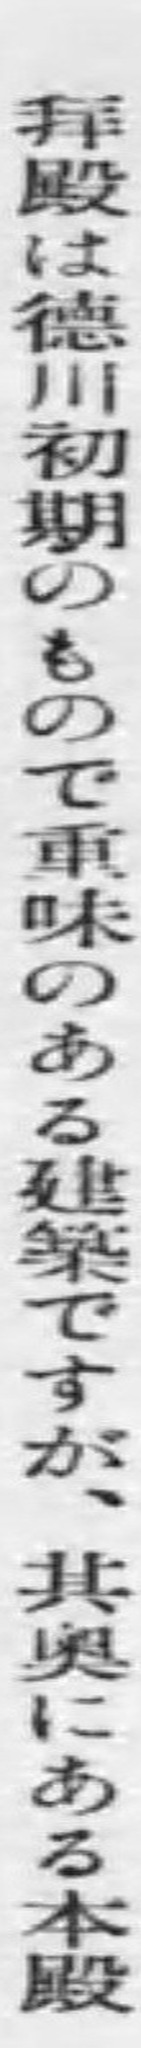拝殿は徳川初期のもので重味のある建築ですが、其奥にある本殿
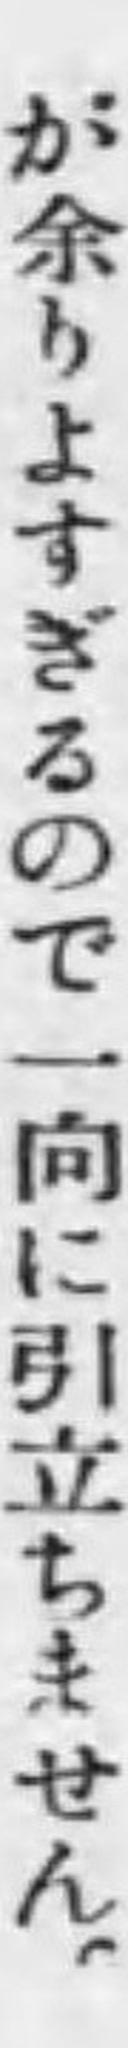が余りよすぎるので一向に引立ちません。
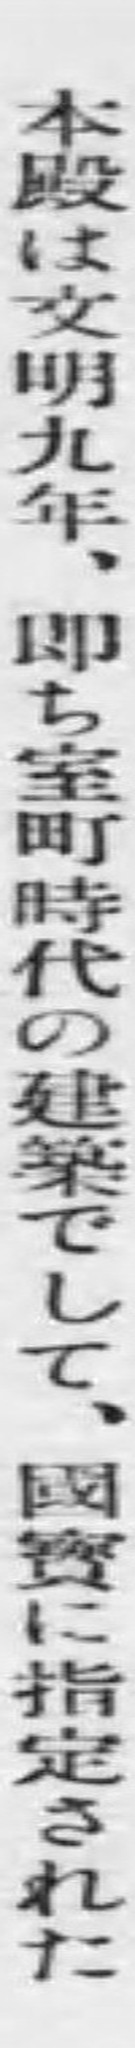本殿は文明九年、即ち室町時代の建築でして、国宝に指定された
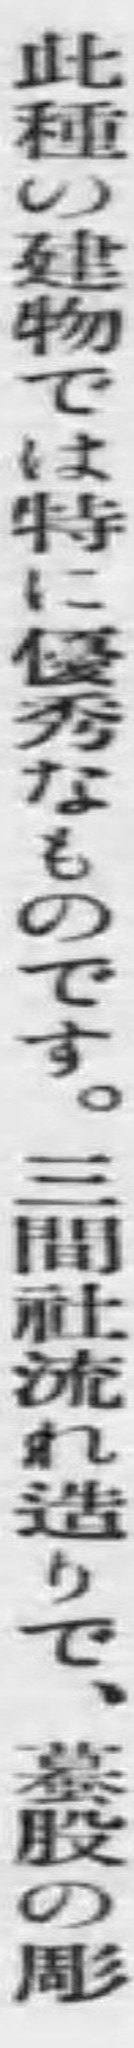此種の建物では特に優秀なものです。三間社流れ造りで、蟇股の彫
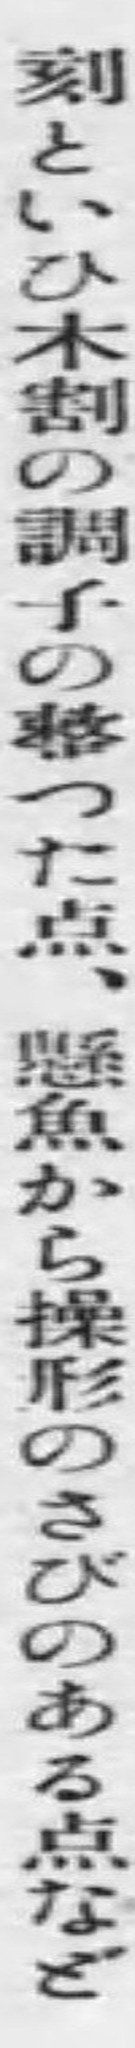刻といひ木割の調子の整つた点、懸魚から操形のさびのある点など
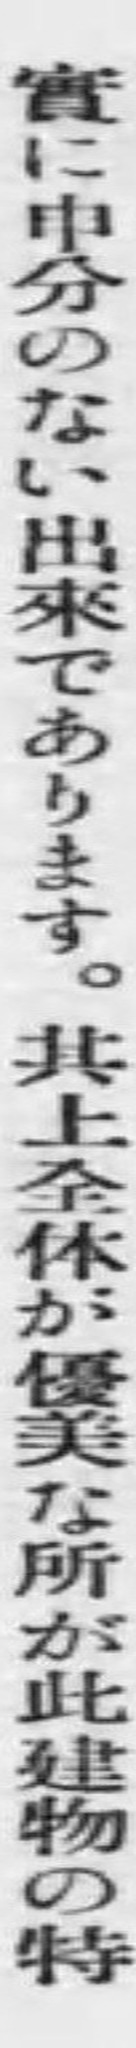実に申分のない出来であります。其上全体が優美な所が此建物の特
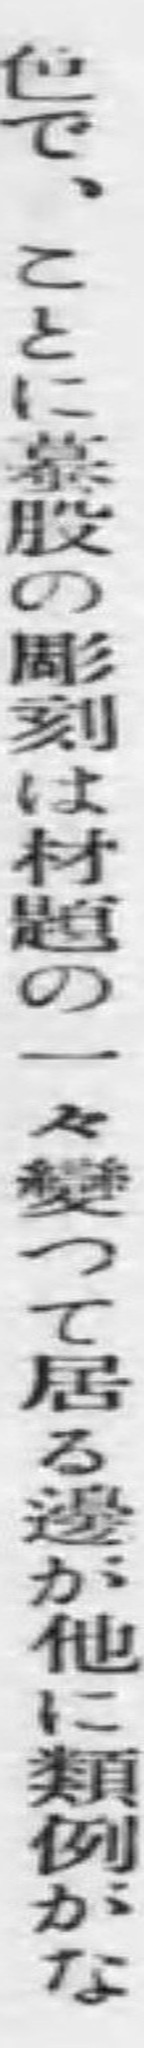色で、ことに蟇股の彫刻は材題の一々変つて居る辺が他に類例がな
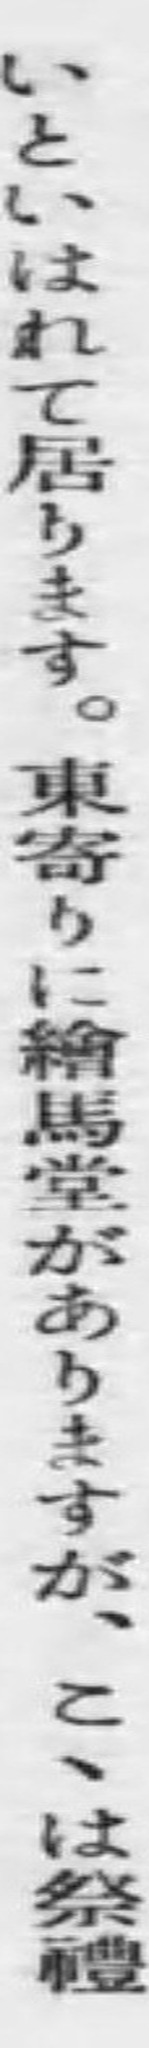いといはれて居ります。東寄りに絵馬堂がありますが、こゝは祭礼
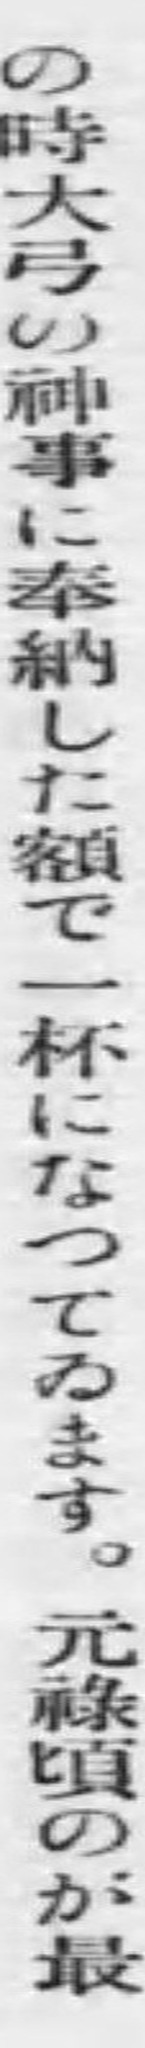の時大弓の神事に奉納した額で一杯になつてゐます。元禄頃のが最
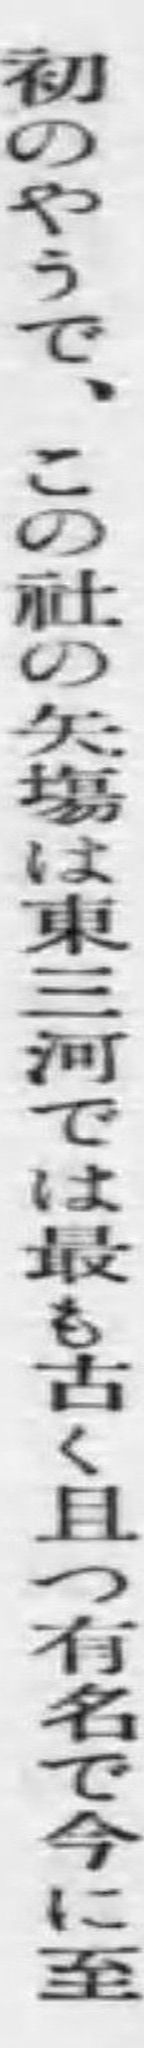初のやうで、この社の矢場は東三河では最も古く且つ有名で今に至
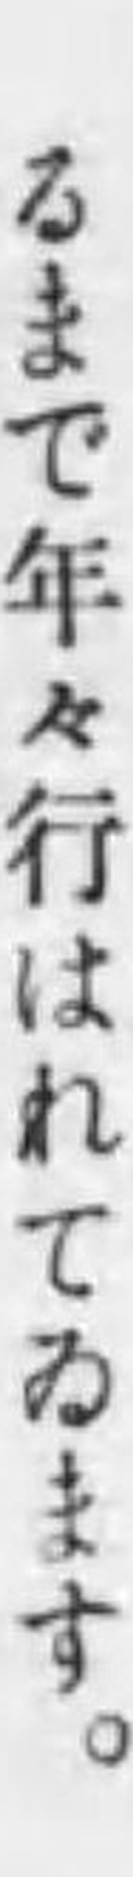るまで年々行はれてゐます。
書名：東三河道中記 : 豊橋市及其附近案内
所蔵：国立国会図書館 National Diet Library, JAPAN
